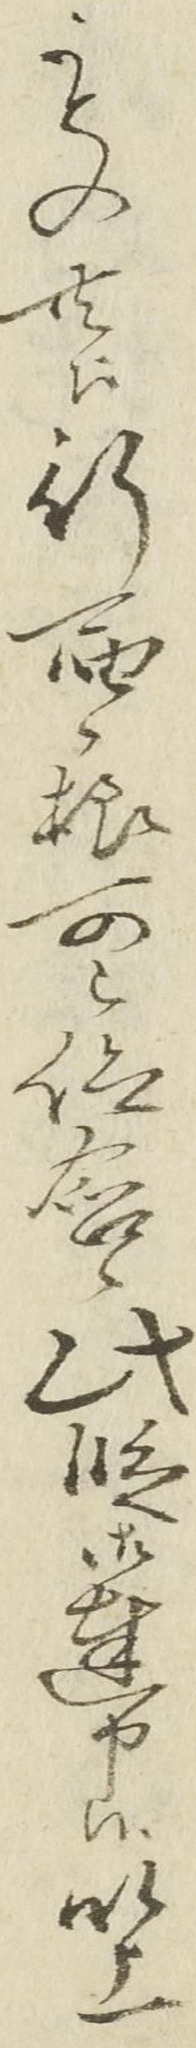もの共え行届候様可被仰含候此段御達申候以上
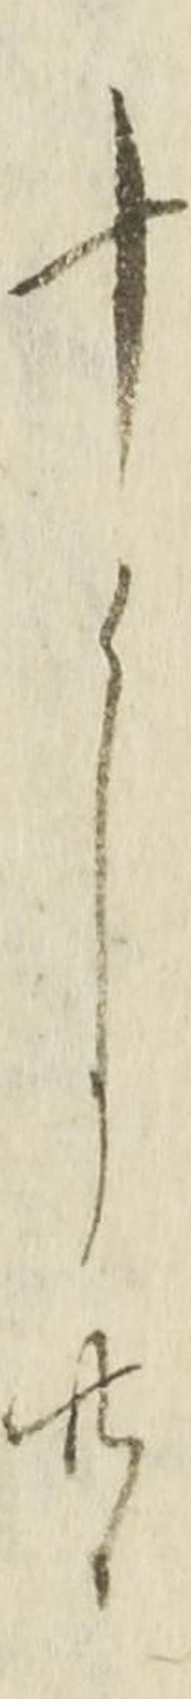十月廿日
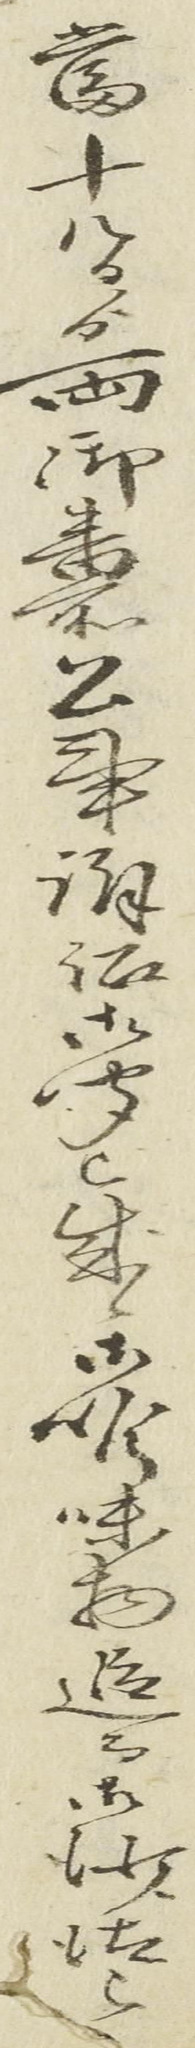当十八日ゟ両御番所公事訴訟御聞被成候御吟味物追而御沙汰被
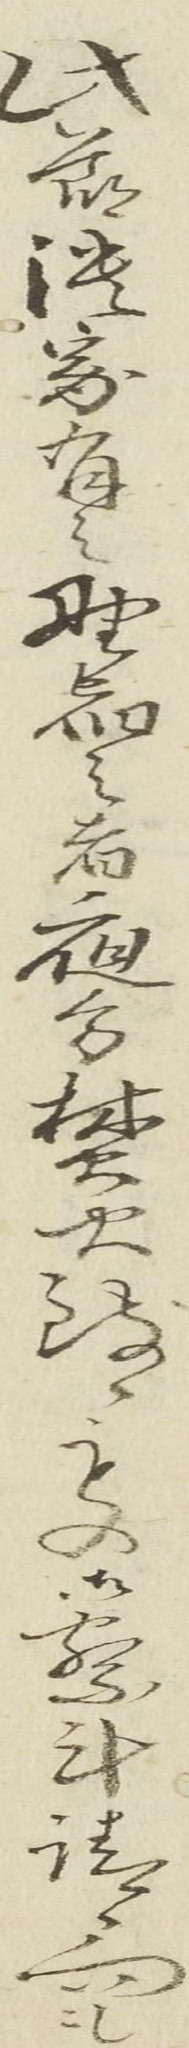一此節潰家有之野宿之者夜分焚火致候もの御察斗請候向も
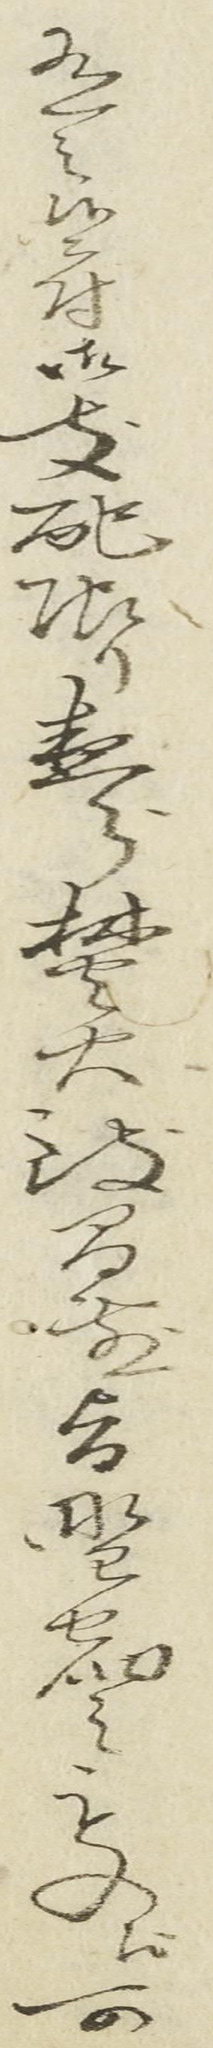有之候ニ付御支配限り夜分焚火致間敷旨野宿之ものえ可
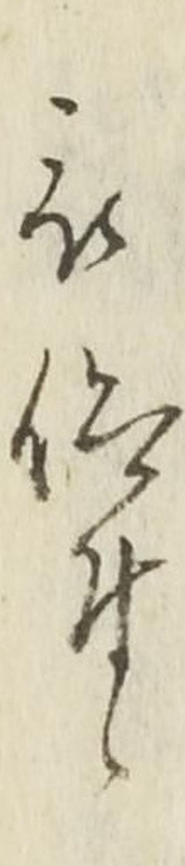被仰付候
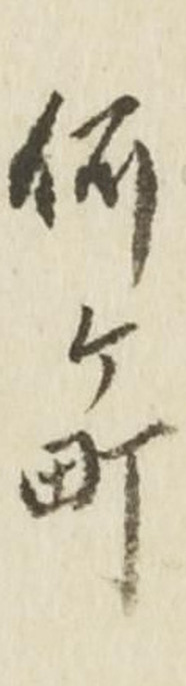何ケ町
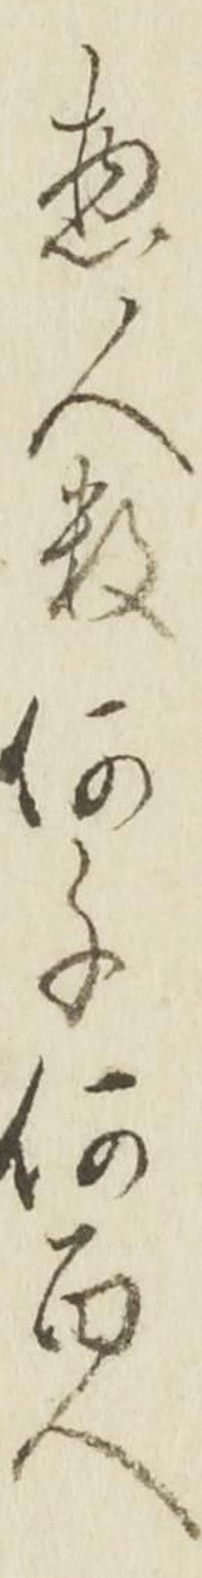惣人数何千何百人
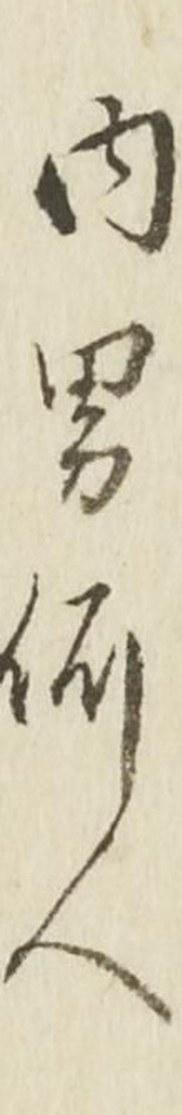内男何人
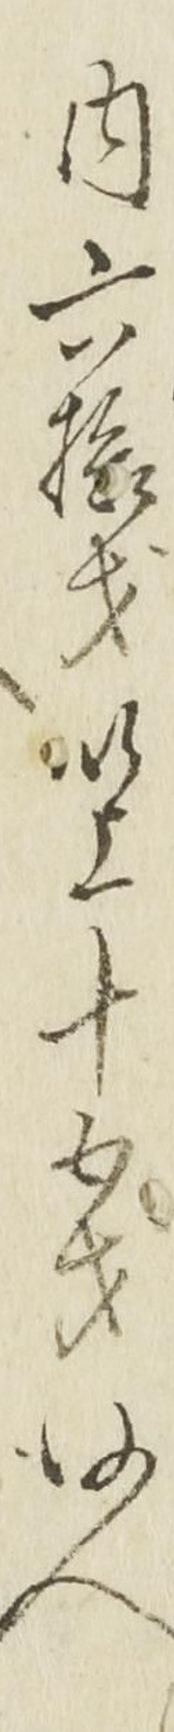内六拾才以上十五才何人
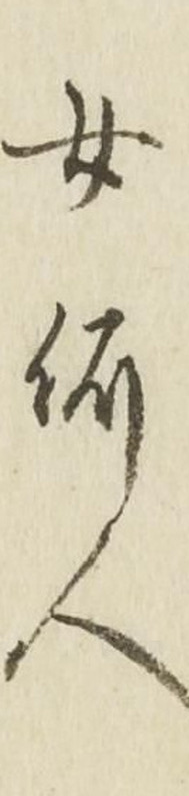女何人
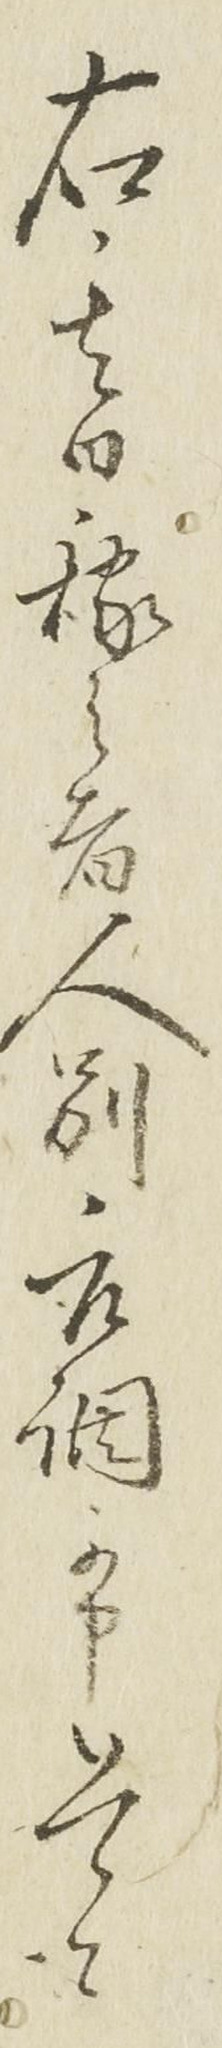右は日稼之者人別取調可申上候以上
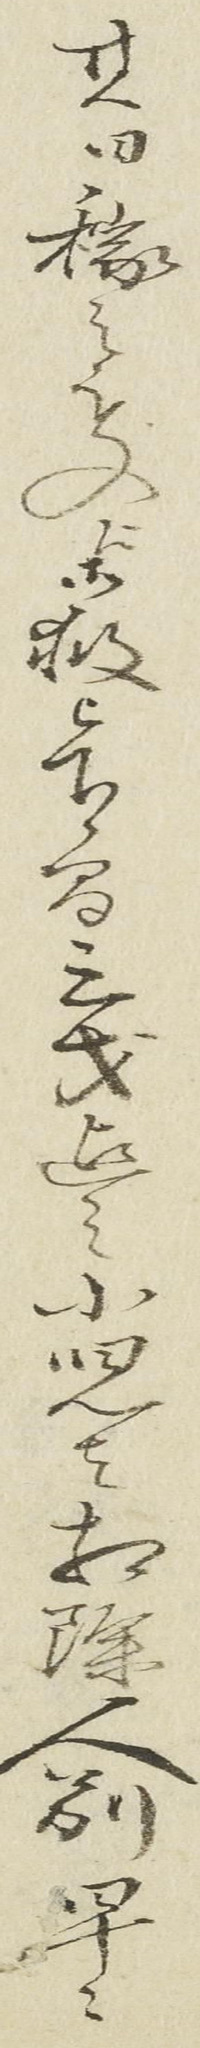其日稼之ものえ御救被下候間三才迄之小児を相除人別早々
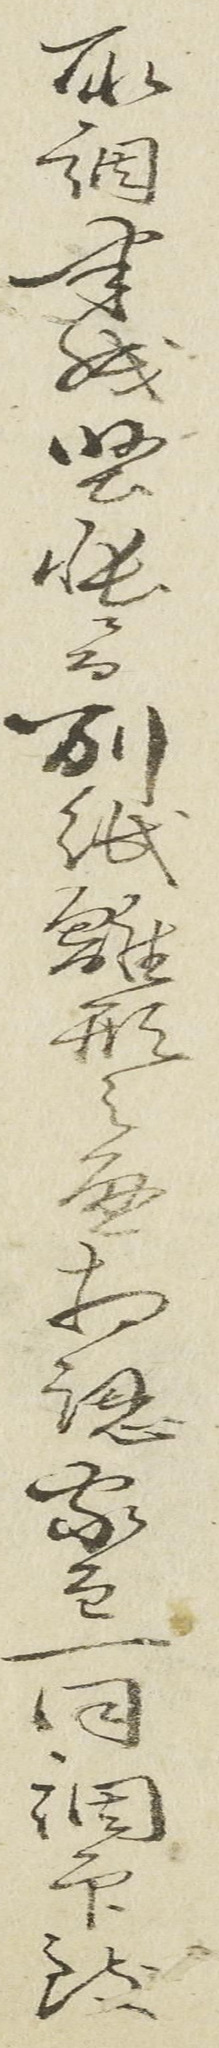取調半紙堅帳ニ而別紙雛形之通相認家主一同調印致
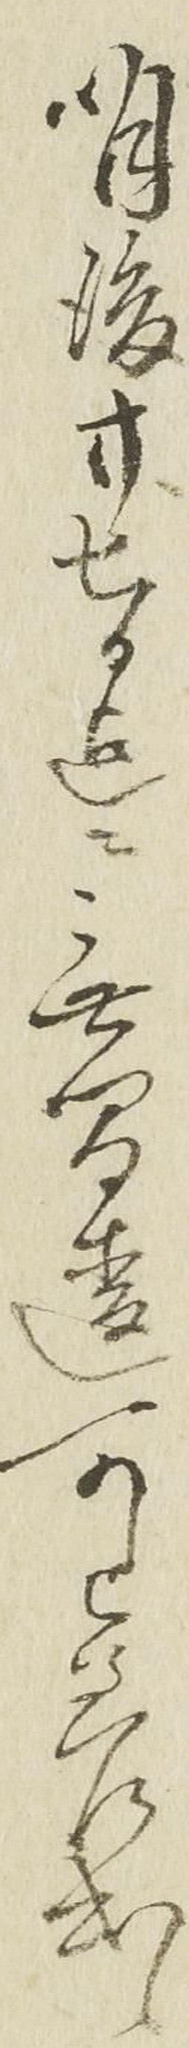明後廿七日迄ニ無間違可被差出候
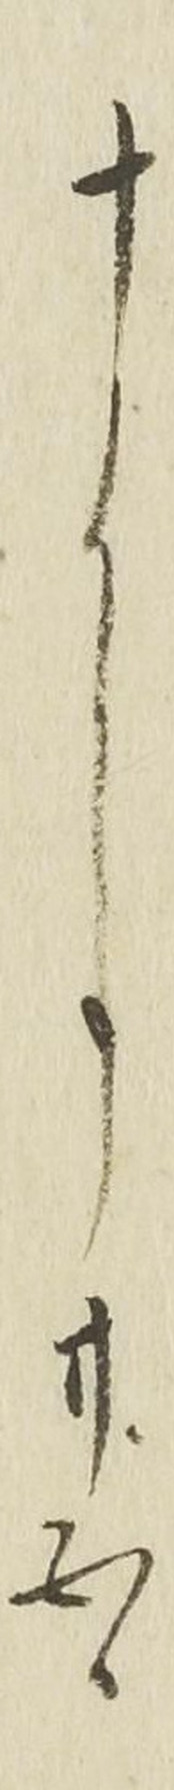十月廿五日
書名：安政二乙卯年十月二日大地震之事
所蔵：東京大学地震研究所図書室 Earthquake Research Institute Library, The University of Tokyo, JAPAN
